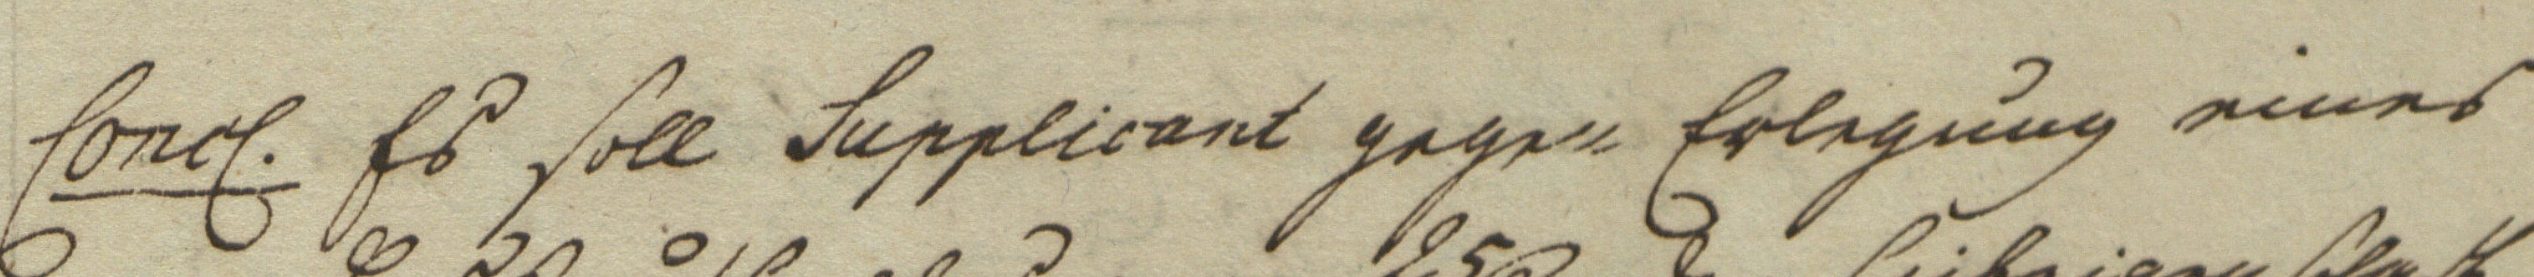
Concl. Es soll Supplicant gegen Erlegung eines
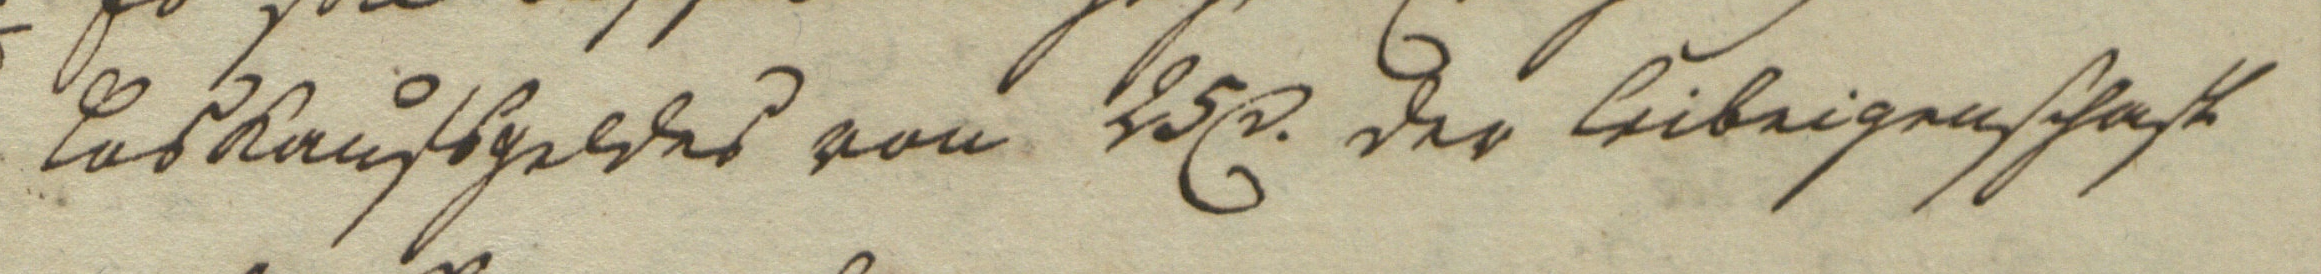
Loskaufsgeldes von 25 l. der Leibeigenschaft
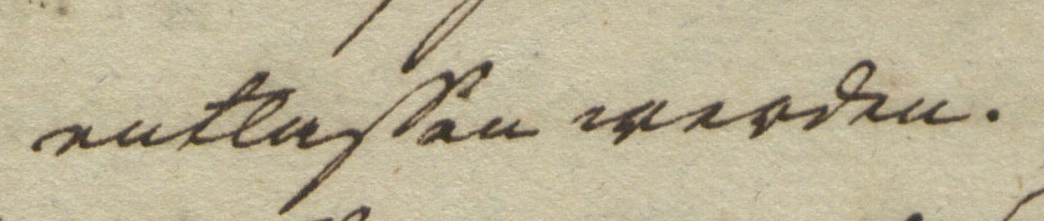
entlassen werden.
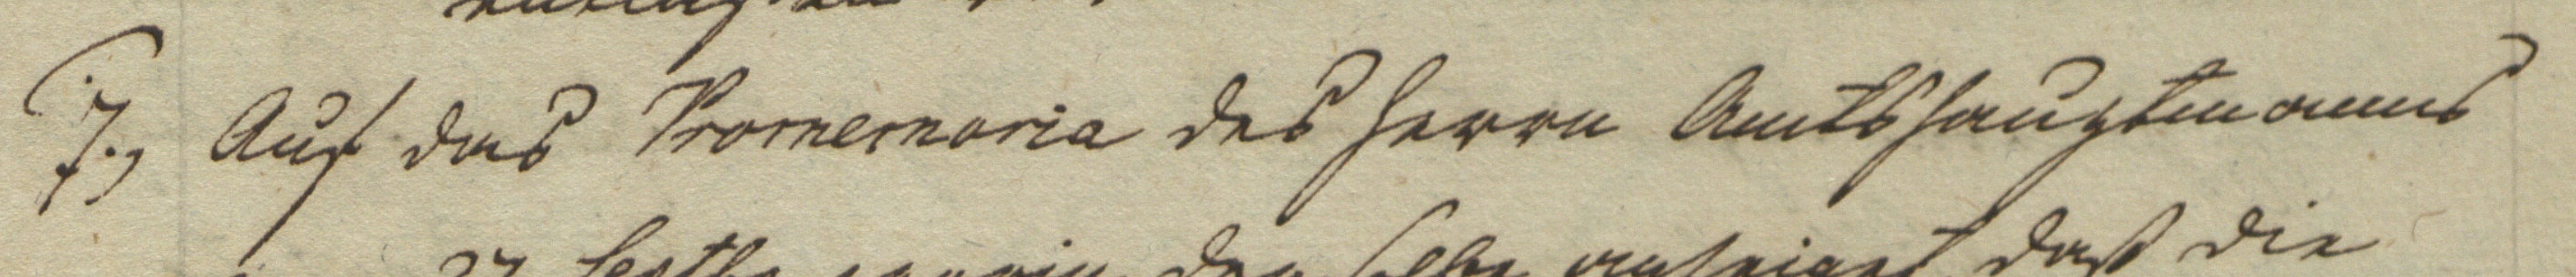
7., Auf das Promemoria des Herrn Amtshauptmanns
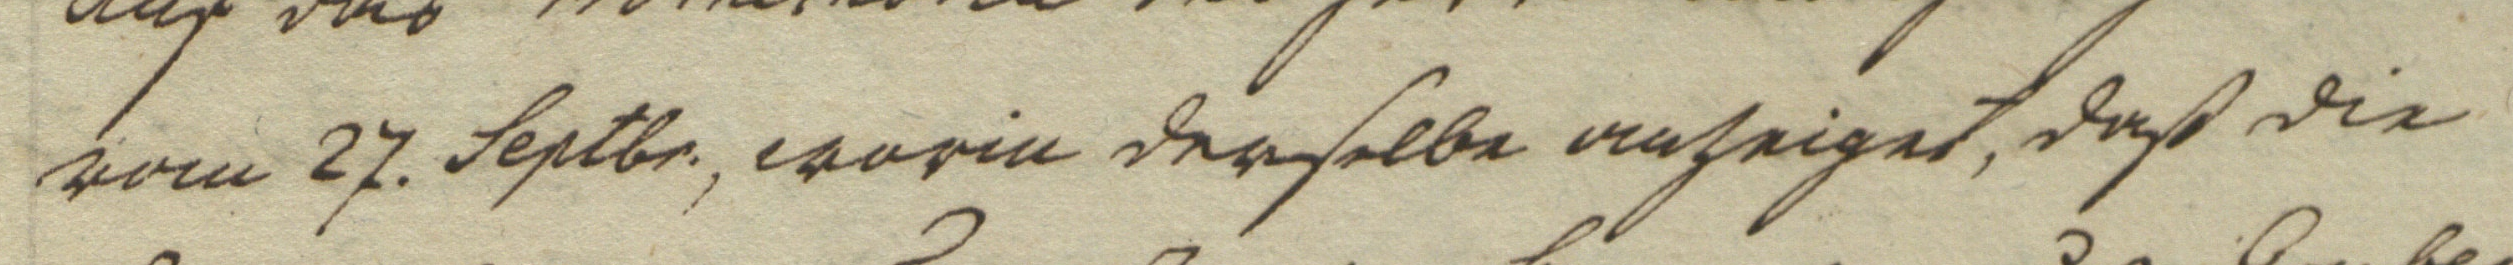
vom 27. Septbr., worin derselbe anzeiget, daß die
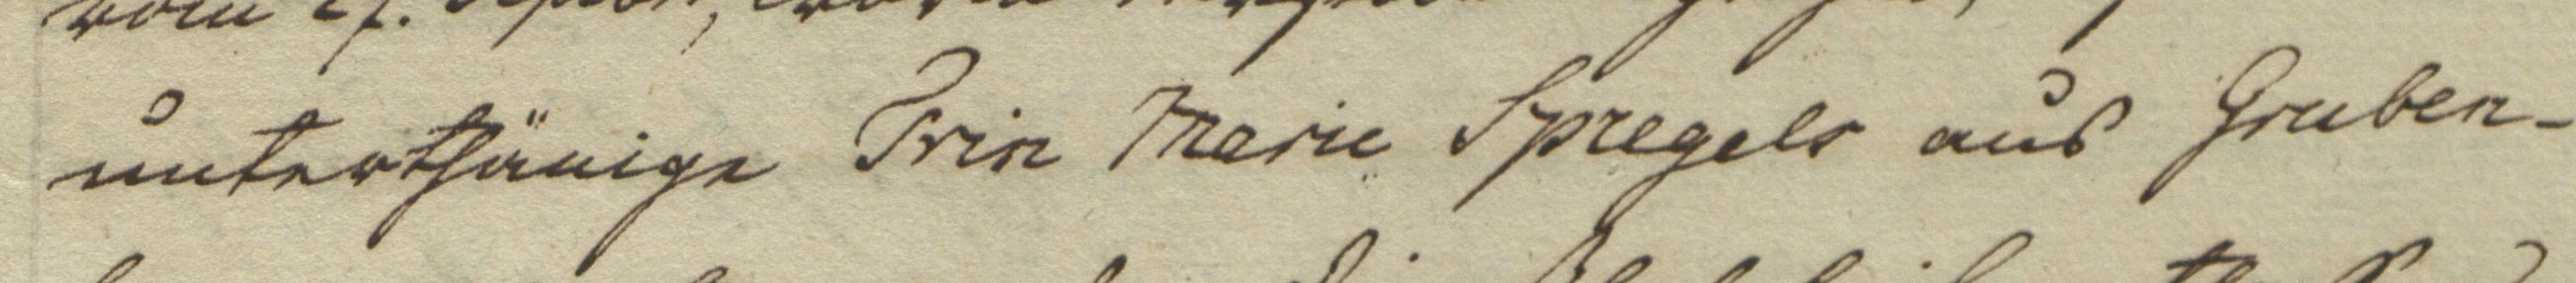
unterthänige Trin Marie Spregels aus Gruben¬
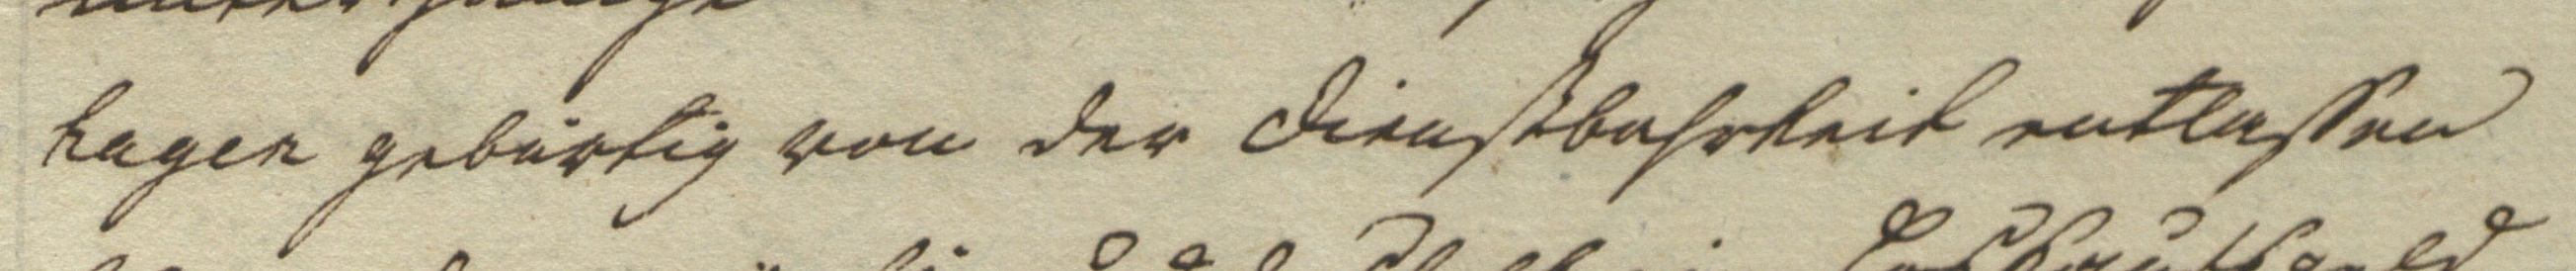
hagen gebürtig von der Dienstbahrkeit entlassen
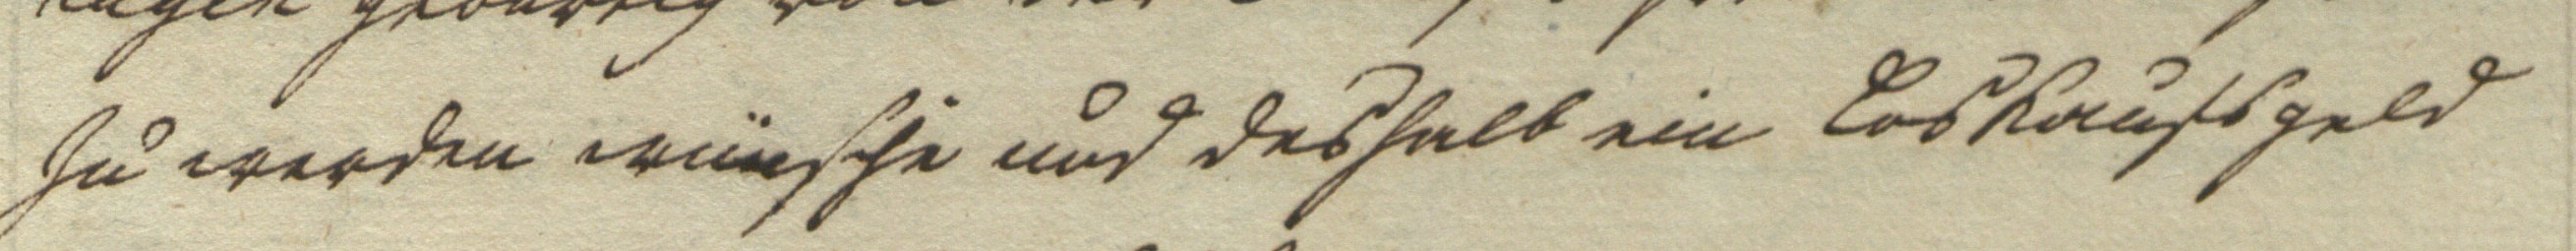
zu werden wünsche und deshalb ein Loskaufsgeld
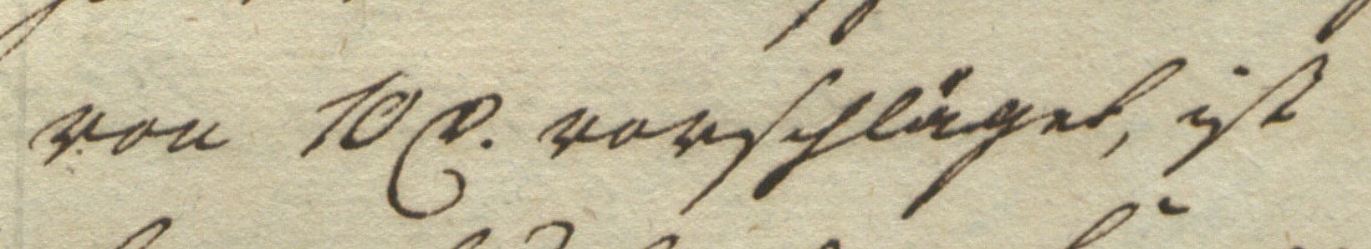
von 10 rl. vorschläget, ist
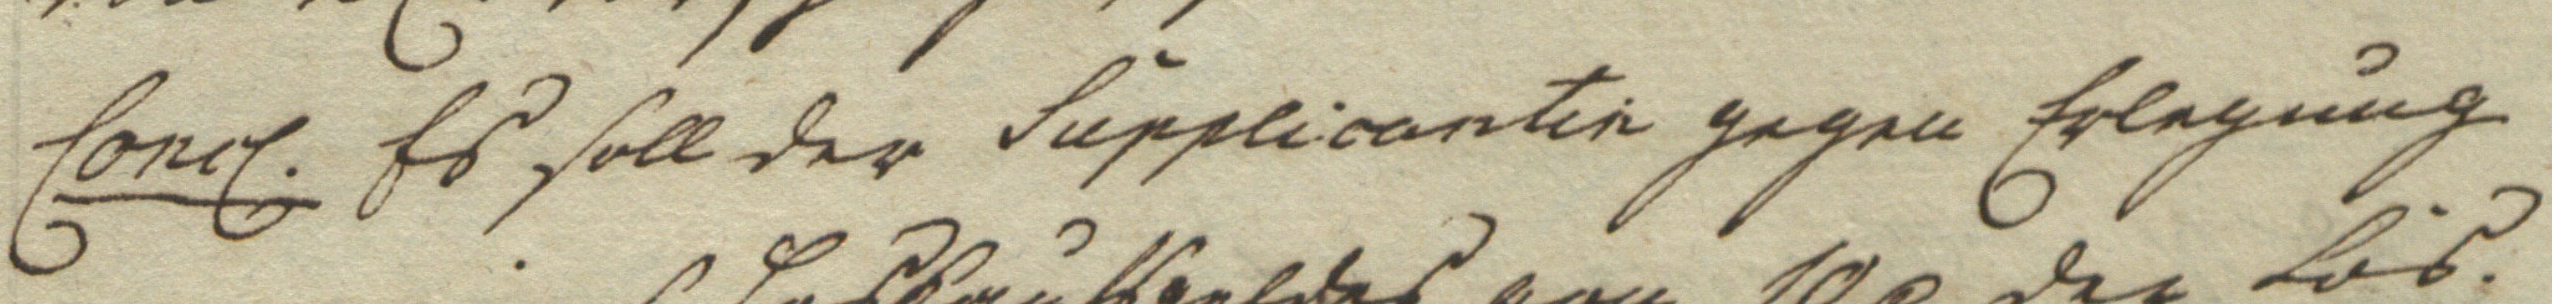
Concl. Es soll der Supplicanten gegen Erlegung
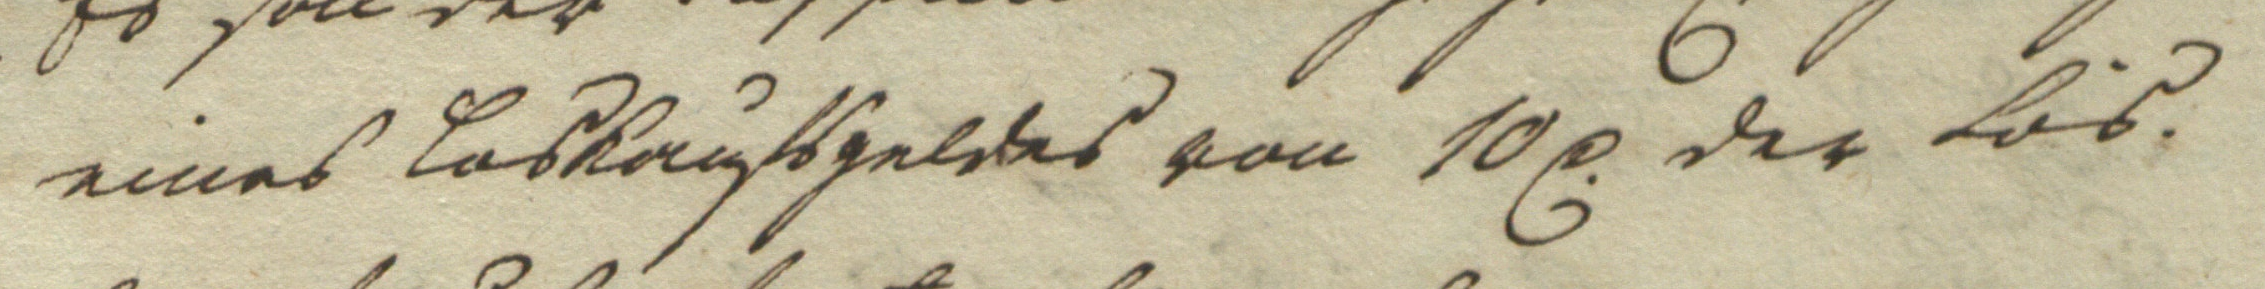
eines Loskaufsgeldes von 10 l. der Los¬
